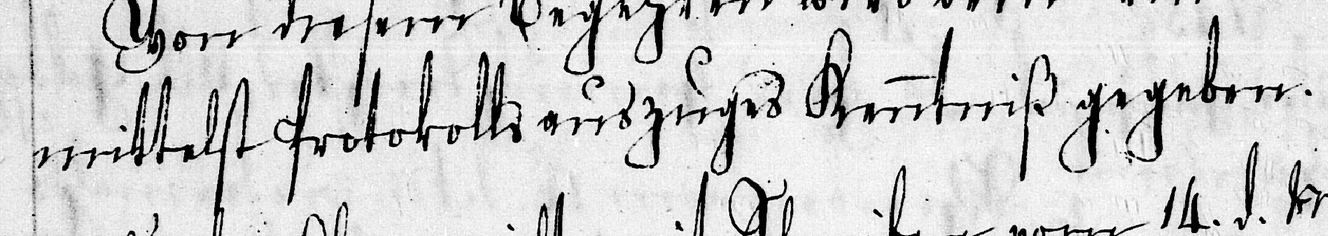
mittelst Protokollsauszuges Kenntniß gegeben.
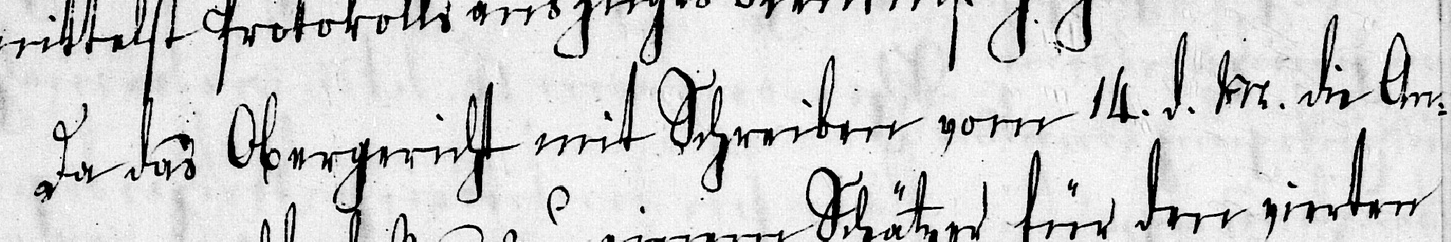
Da das Obergericht mit Schreiben vom 14. d. M. die An¬
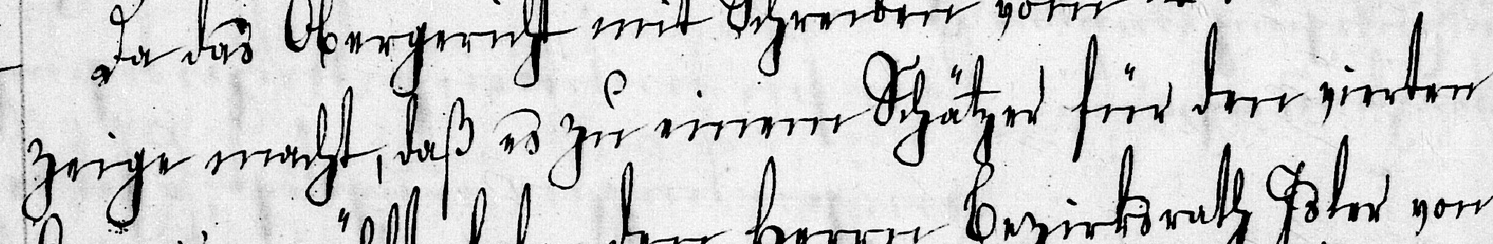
zeige macht, daß es zu einem Schätzer für den vierten
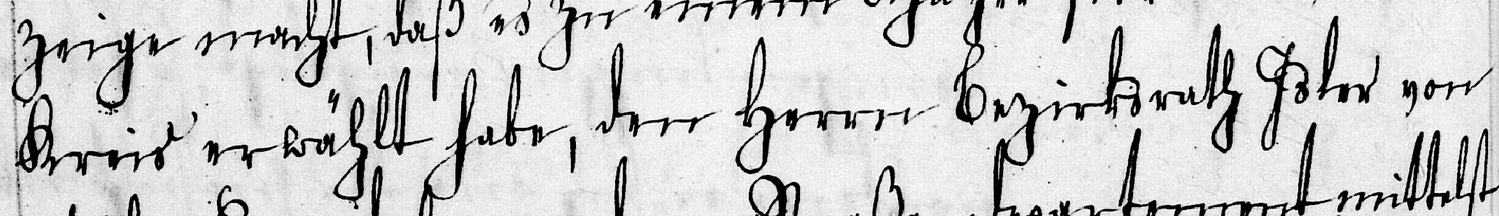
Kreis erwählt habe, den Herrn Bezirksrath Isler von
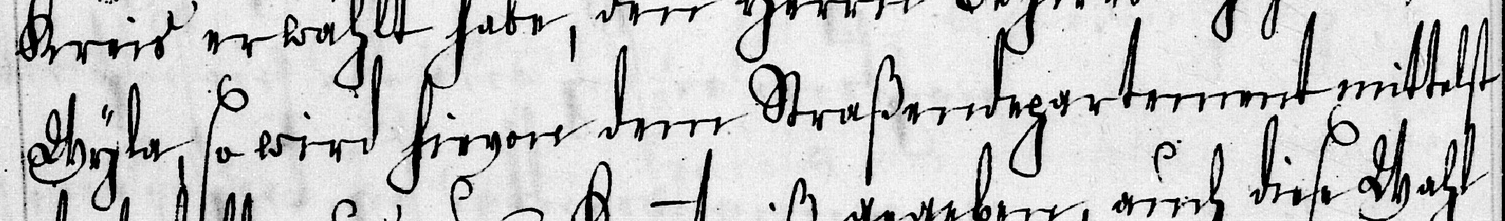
Wyla, so wird hievon dem Straßendepartement mittel¬
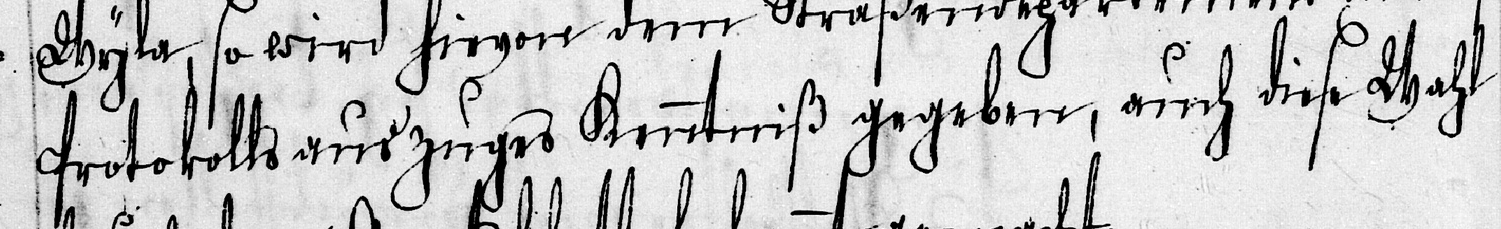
Protokollsauszuges Kenntniß gegeben, auch diese Wahl
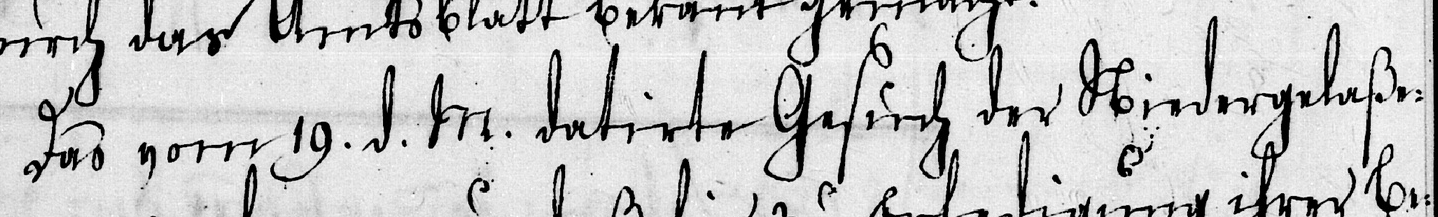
Das vom 19. d. M. datirte Gesuch der Niedergelaße¬
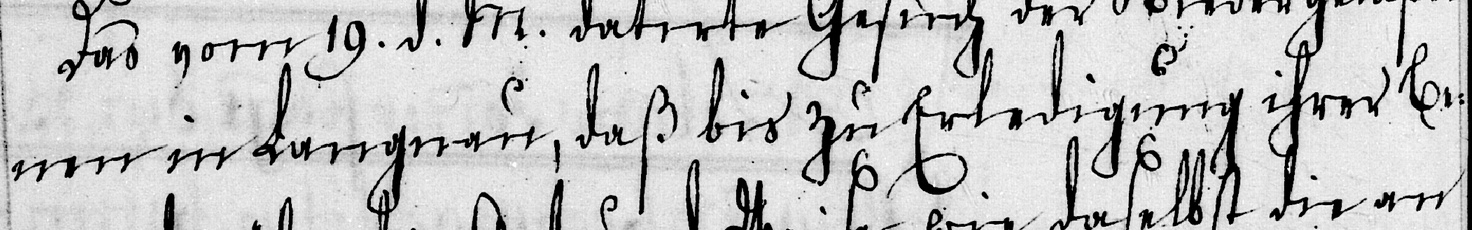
nen in Langnau, daß bis zu Erledigung ihrer Be¬
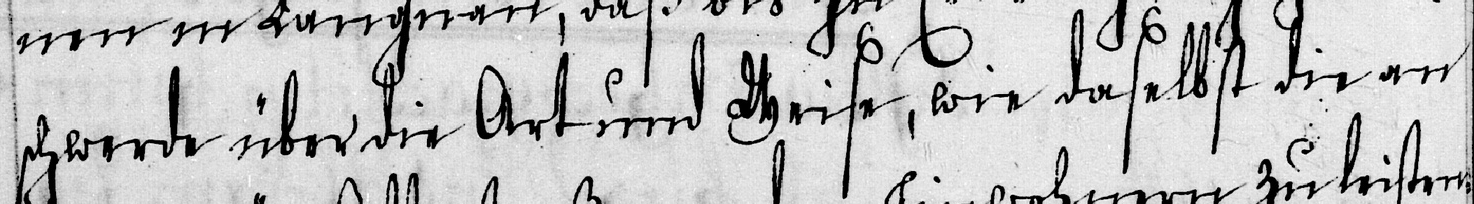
schwerde über die Art und Weise, wie daselbst die an
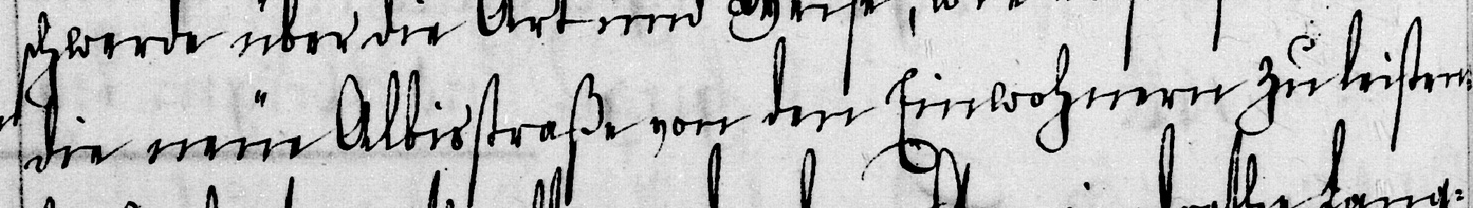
die neue Albisstraße von den Einwohnern zu leisten¬
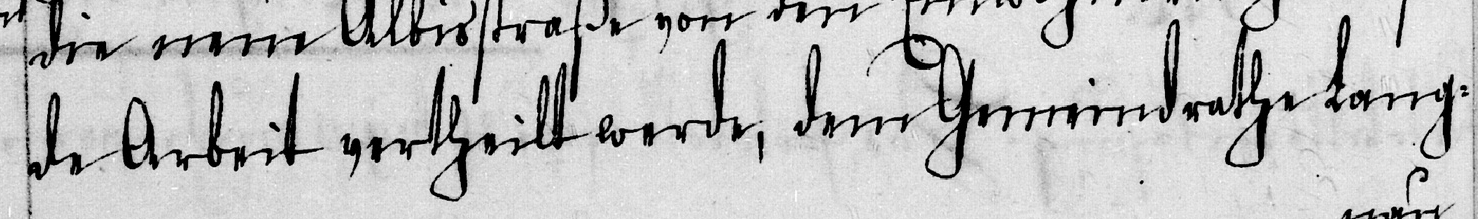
de Arbeit vertheilt werde, dem Gemeindrathe Lang-
